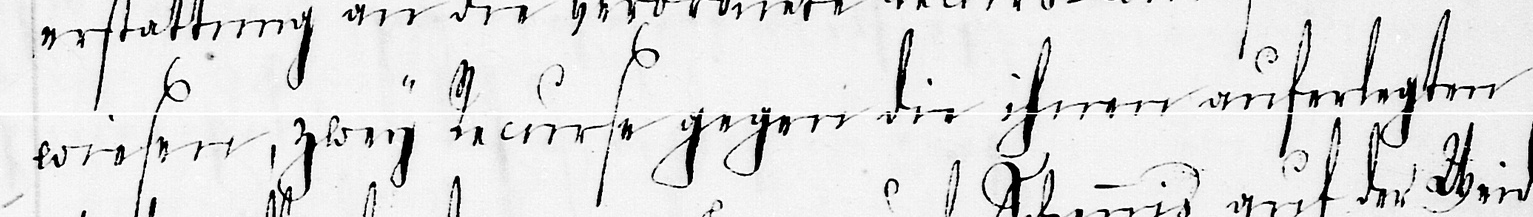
wiesen, zwey Recurse gegen die ihnen auferlegten
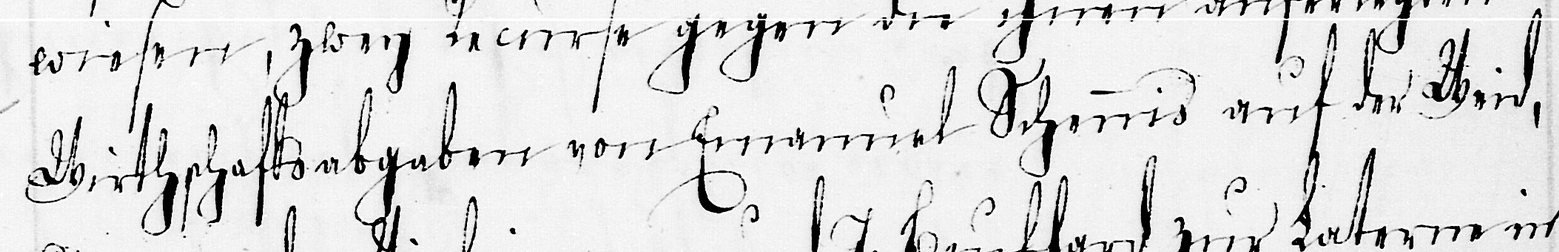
Wirthschaftsabgaben von Emanuel Schennis auf der Weid,
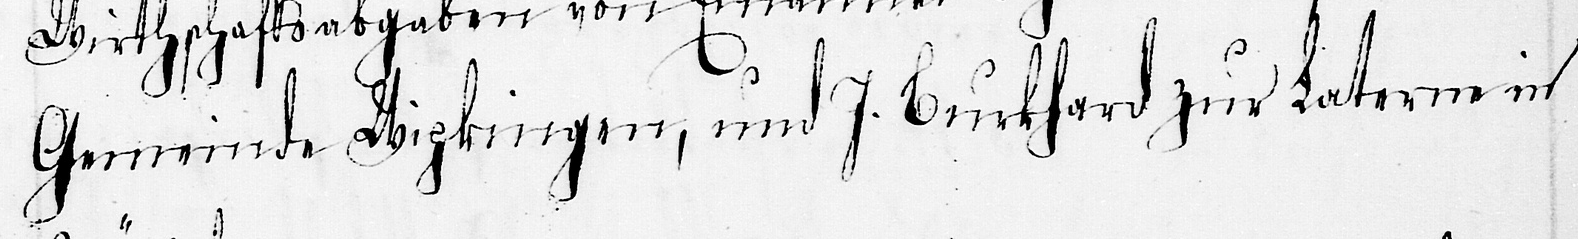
Gemeinde Wipkingen, und J. Burkhard zur Laterne in
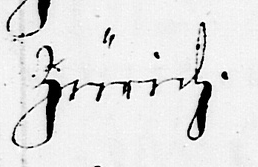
Zürich.
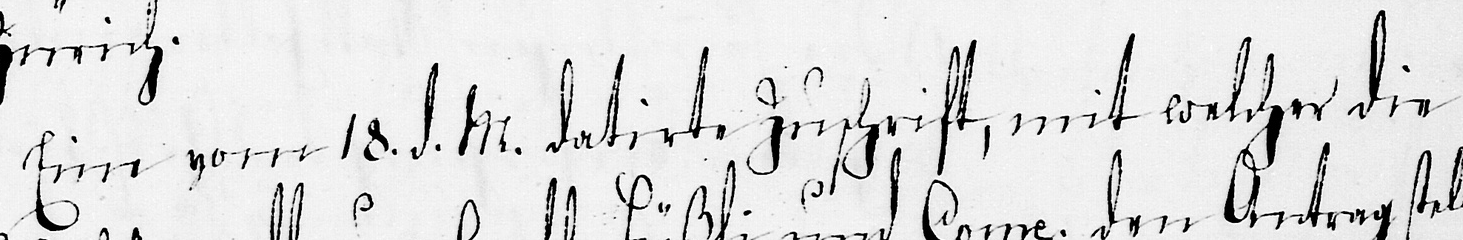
Eine vom 18. d. M. datirte Zuschrift, mit welcher die
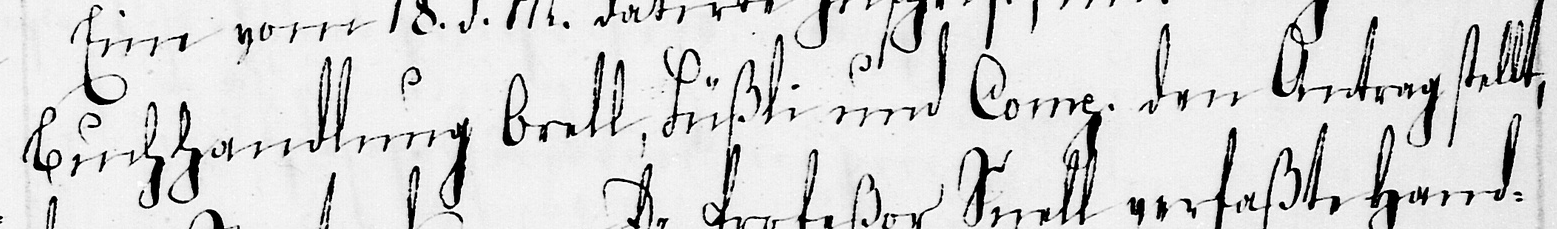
Buchhandlung Orell, Füßli und Comp. den Antrag stel¬
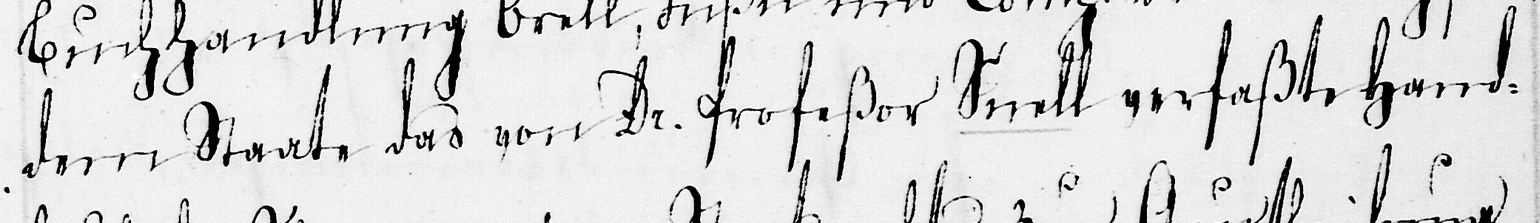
dem Staate das von Dr. Profeßor Snell verfaßte Hand¬
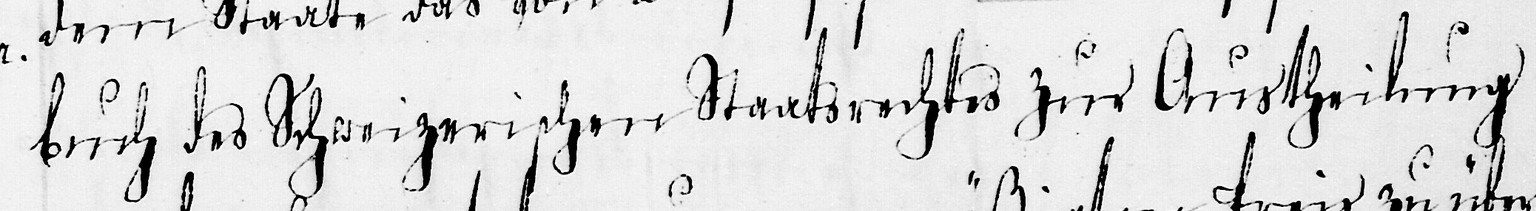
buch des Schweizerischen Staatsrechtes zur Austheilung
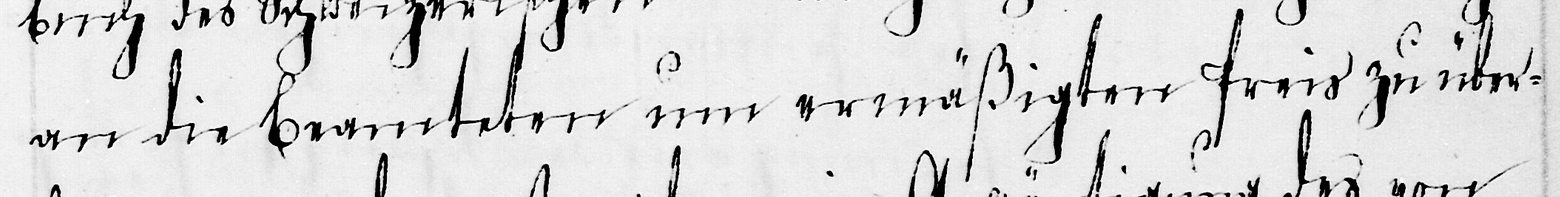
an die Beamteten um ermäßigten Preis zu über¬
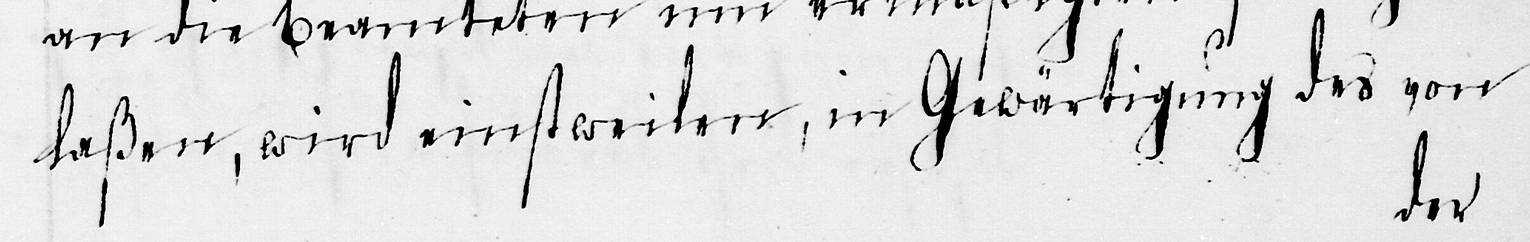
laßen, wird einstweilen, in Gewärtigung des von
